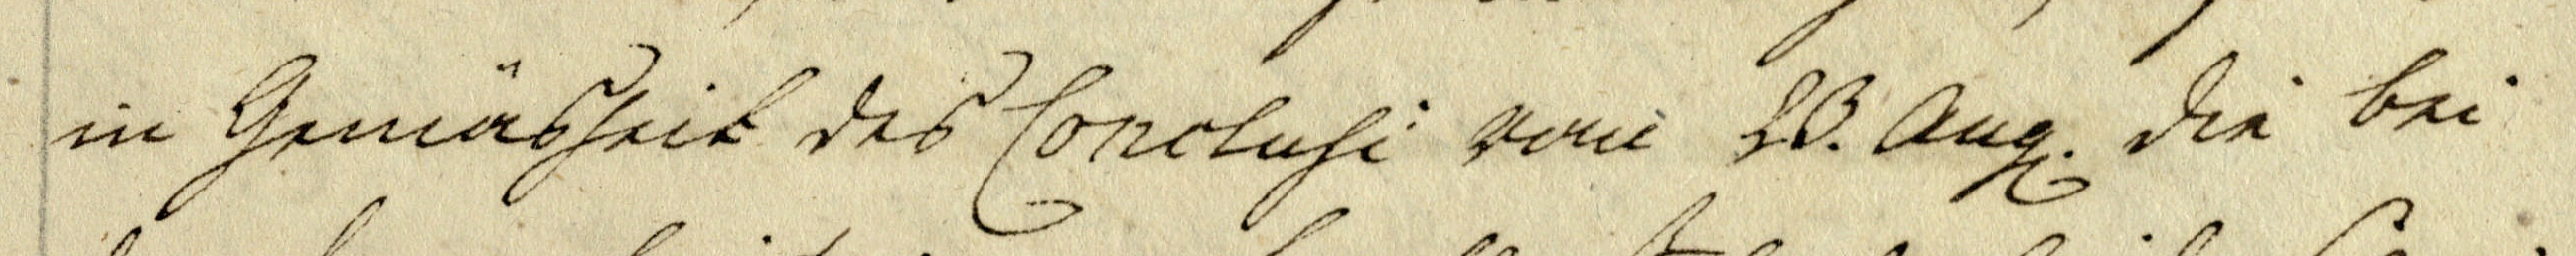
in Gemäsheit des Conclusi von 23. Aug. die bei
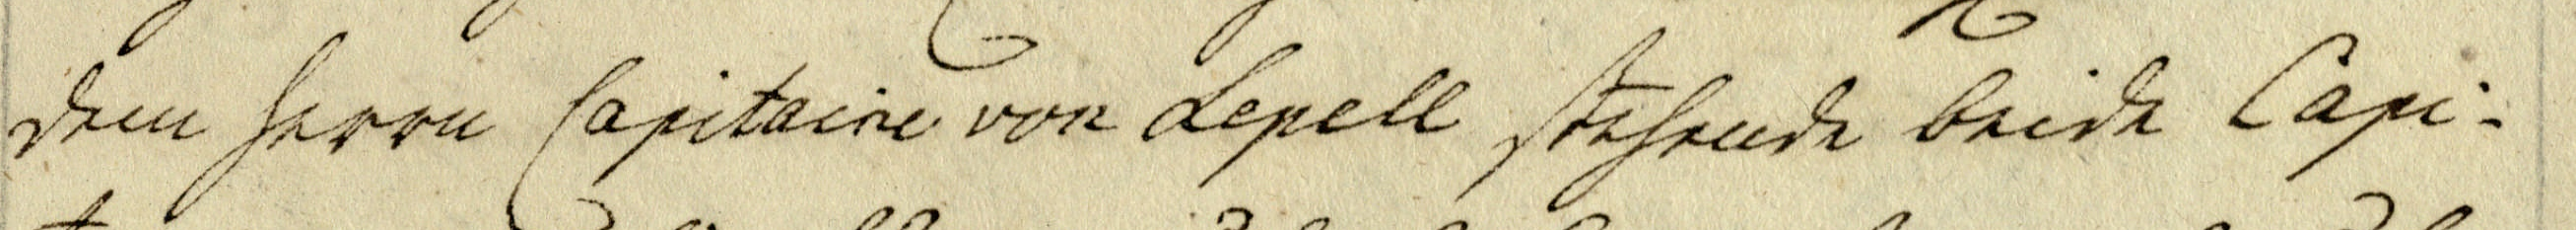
dem Herrn Capitaine von Lepell stehende beide Capi¬
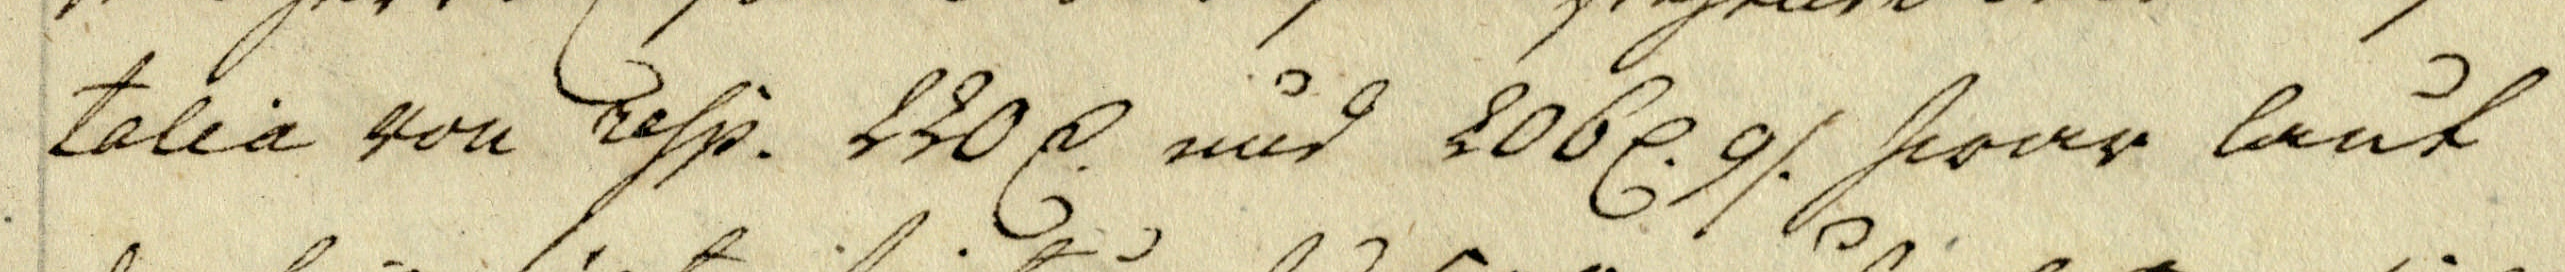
talia von resp. 220 l. und 206 l. 9 s. zwar laut
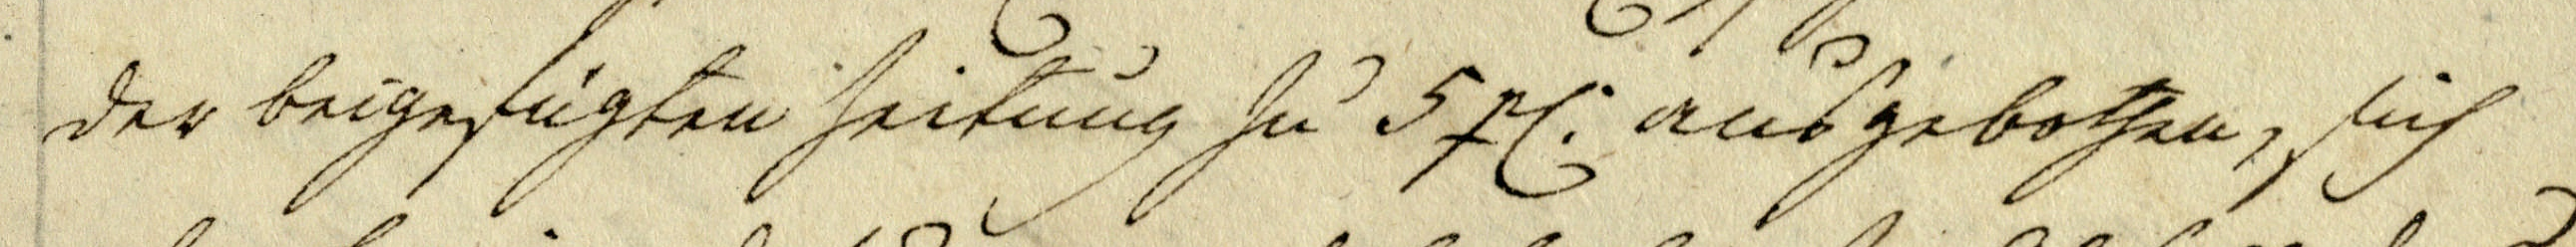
der beigefügten Zeitung zu 5 pl. ausgebothen, sich
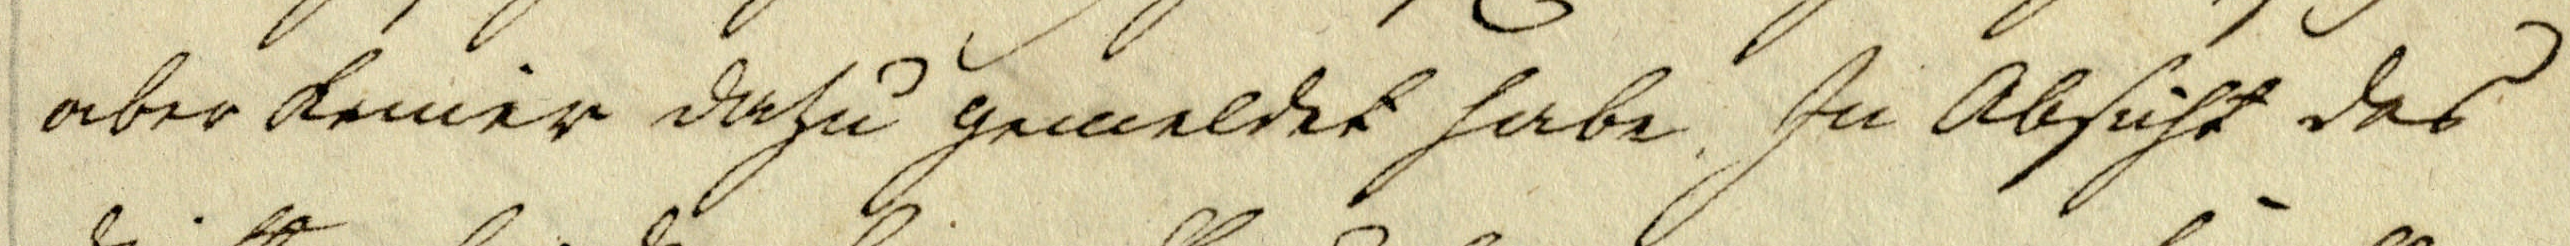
aber keiner dazu gemeldet habe. In Absicht des
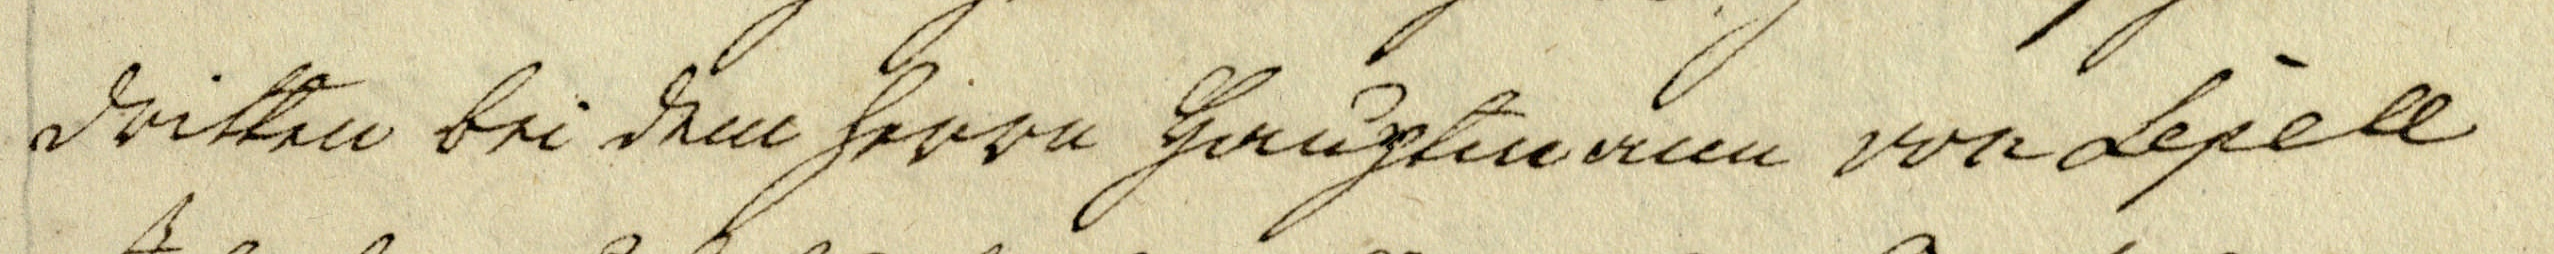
dritten bei dem Herrn Hauptmann von Lepell
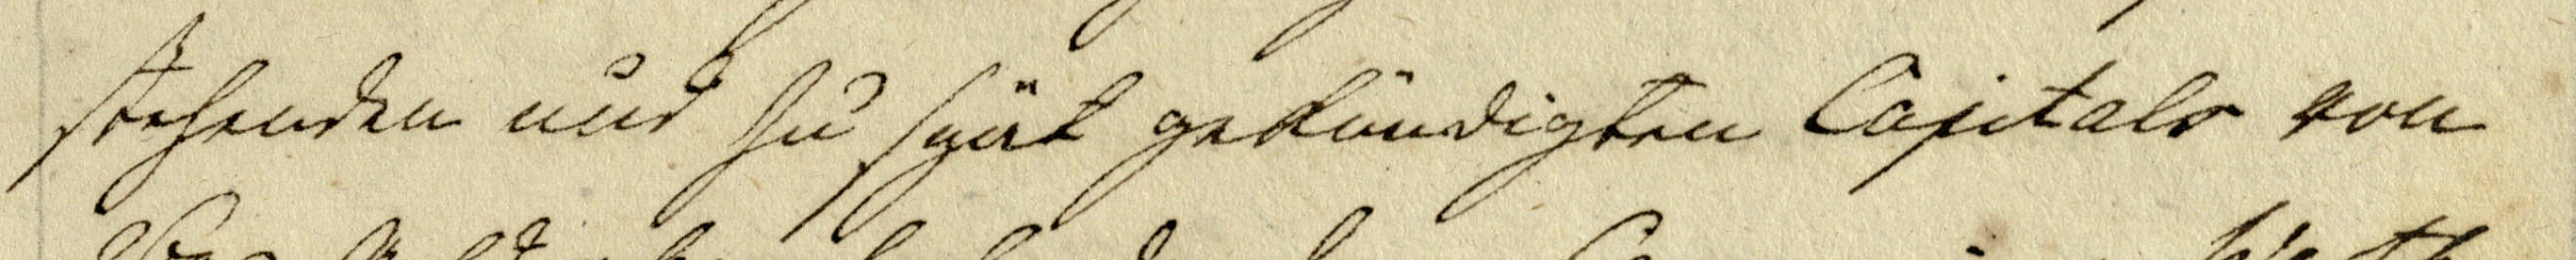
stehenden und zu spät gekündigten Capitals von
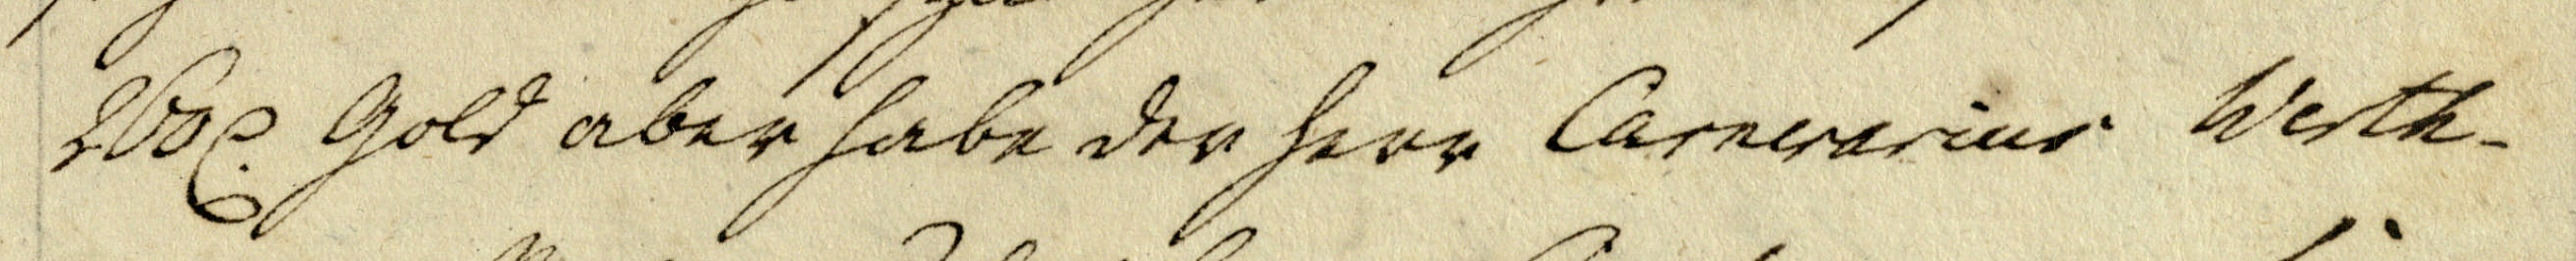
260 l. Gold aber habe der Herr Camerarius Werth¬
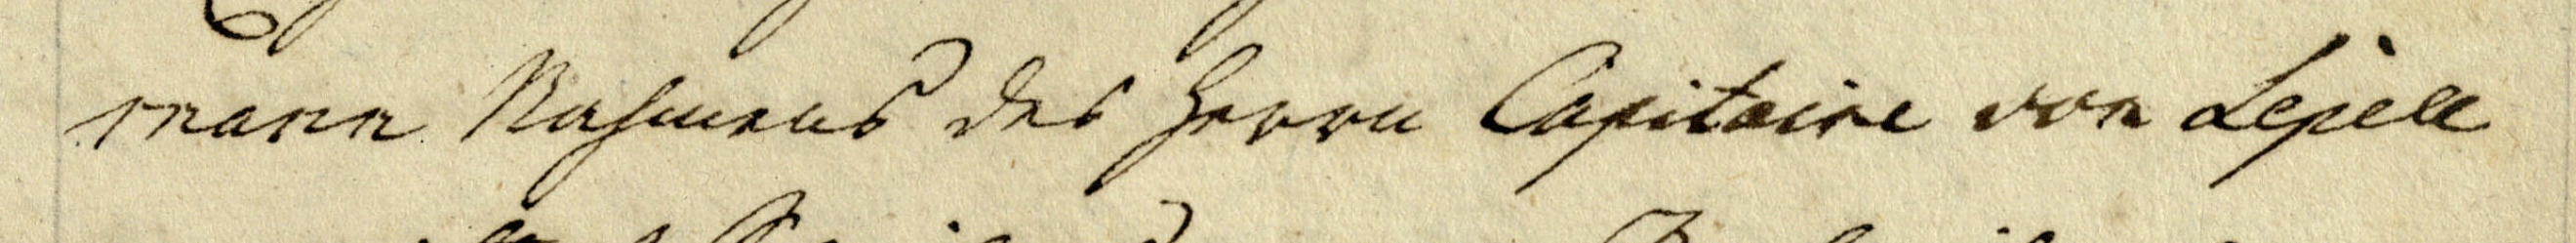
mann Nahmens des Herrn Capitaine von Lepell
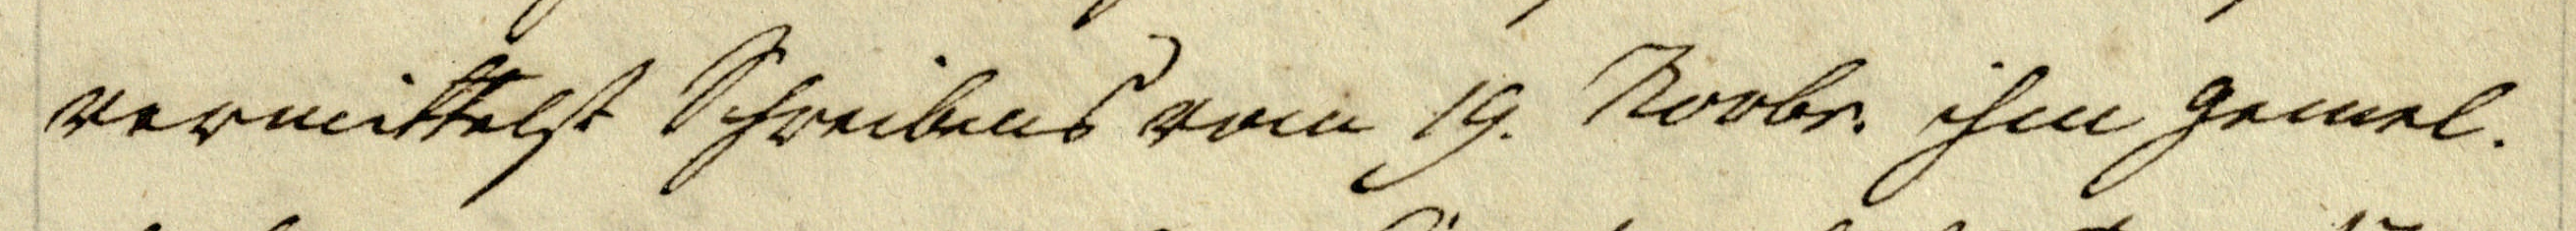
vermittelst Schreibens vom 19. Novbr. ihm gemel¬
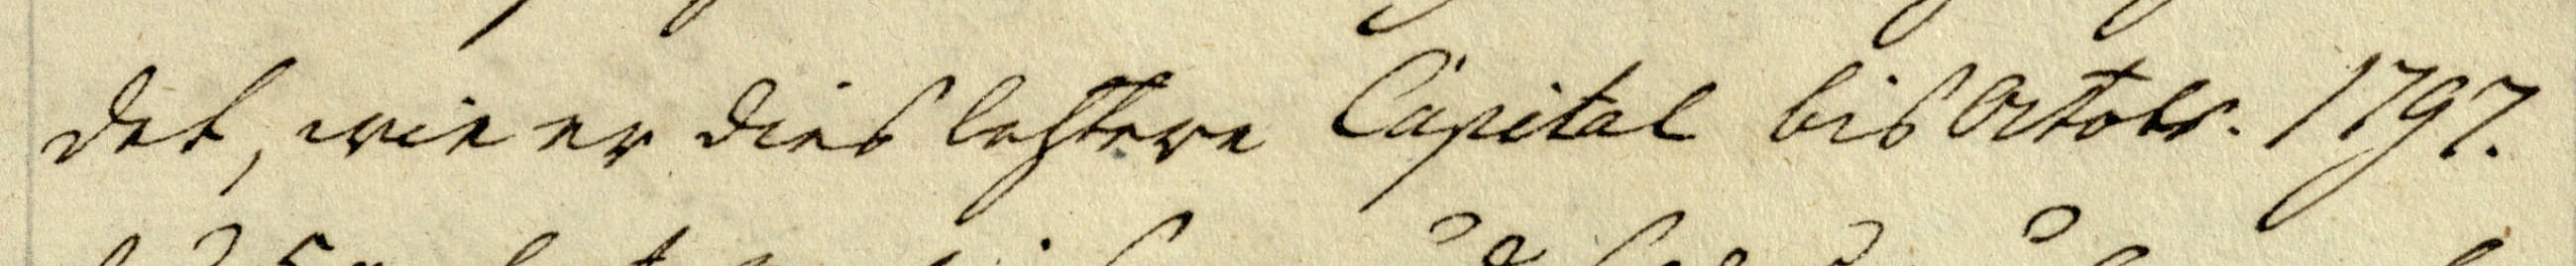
det, wie er dies letztere Capital bis Octbr. 1797.
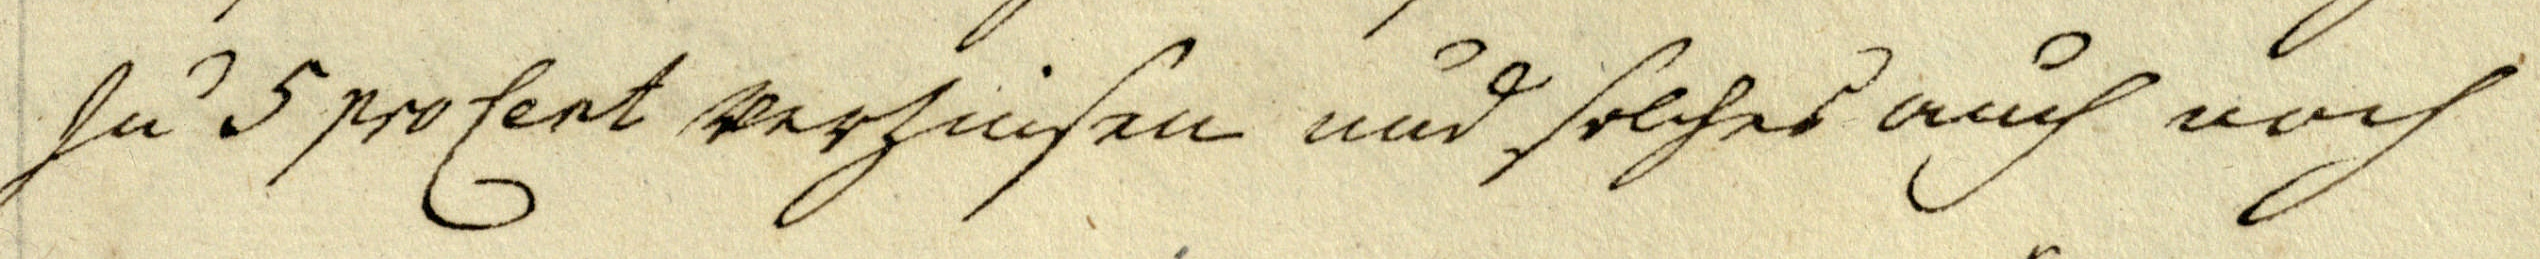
zu 5 procent verzinsen und solches auch noch
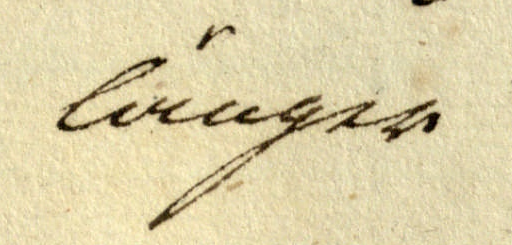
länger
